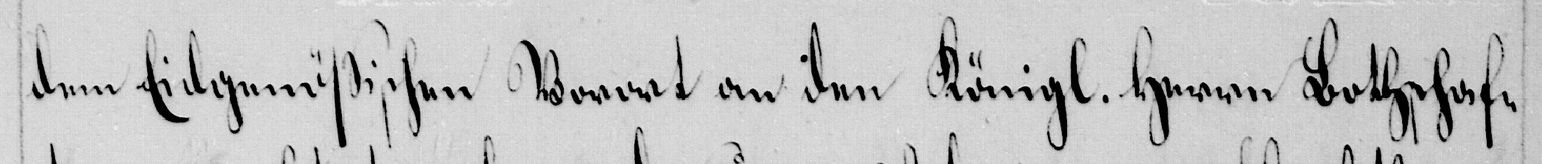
dem Eidgenößischen Vorort an den Königl. Herrn Bothschaf¬
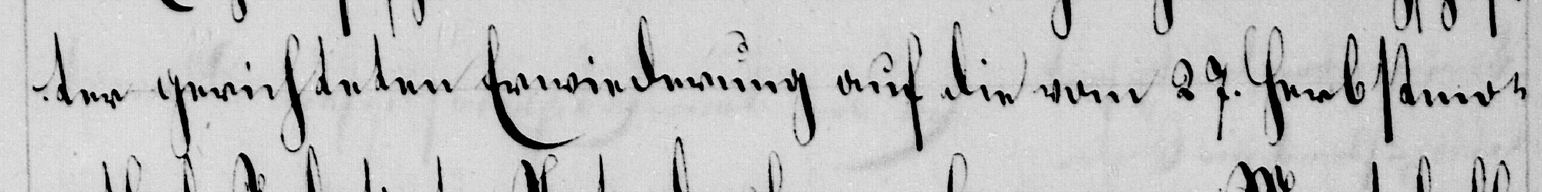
ter gerichteten Erwiederung auf die vom 27. Herbstmo¬
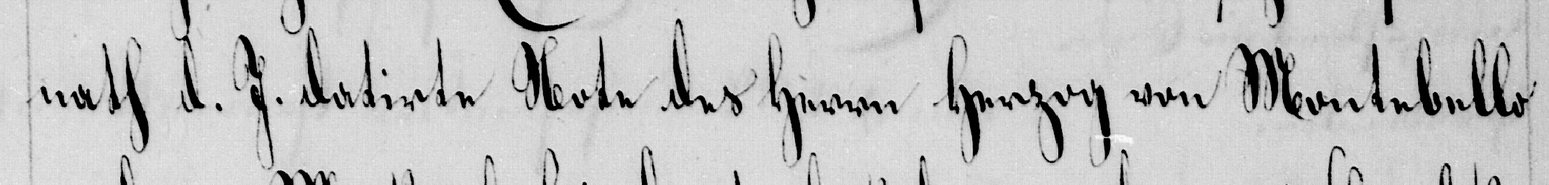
nath d. J. datirte Note des Herrn Herzog von Montebello
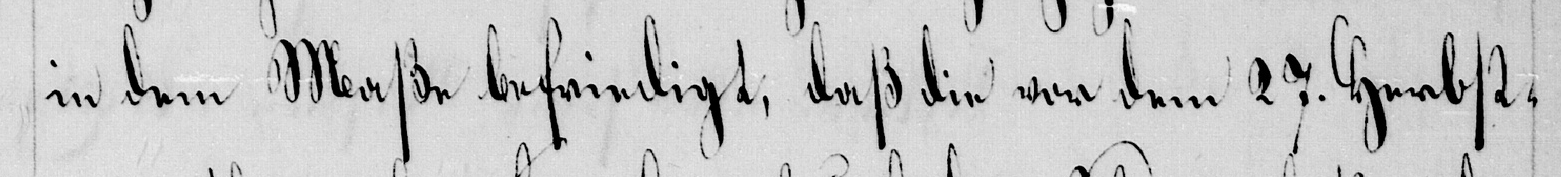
in dem Maße befriedigt, daß die vor dem 27. Herbst¬
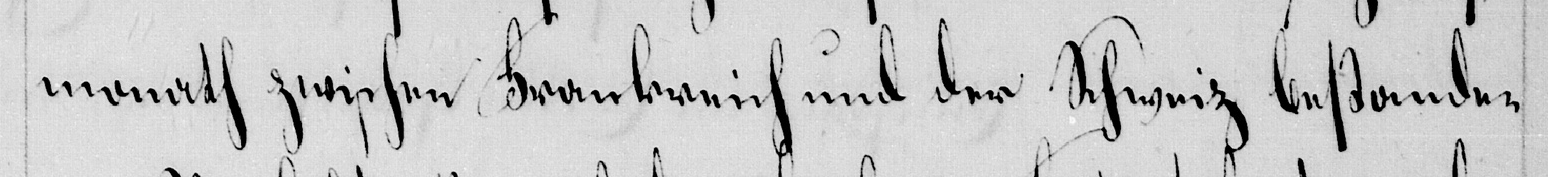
monath zwischen Frankreich und der Schweiz bestande¬
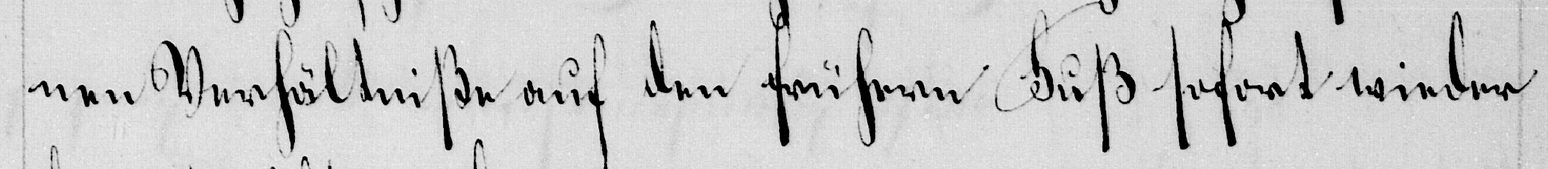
nen Verhältniße auf den frühern Fuß sofort wieder
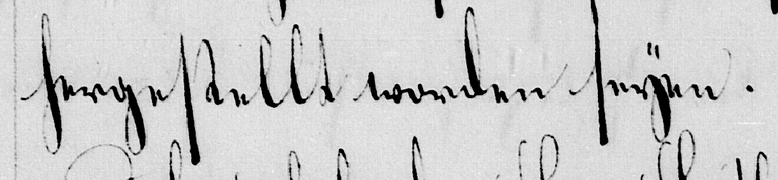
hergestellt worden seyen.
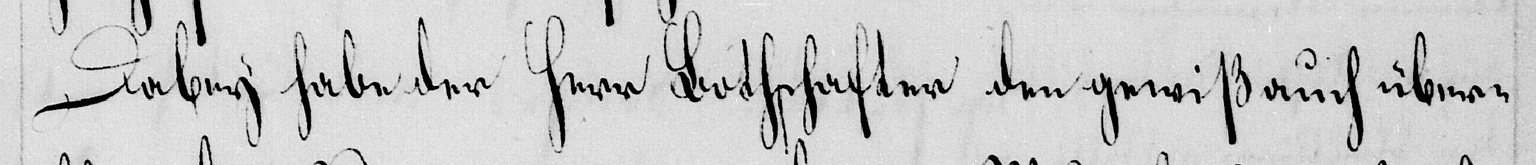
Dabey habe der Herr Bothschafter den gewiß auch über¬
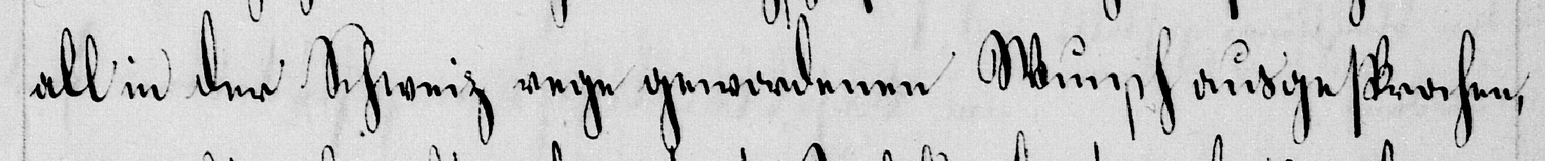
all in der Schweiz rege gewordenen Wunsch ausgesprochen,
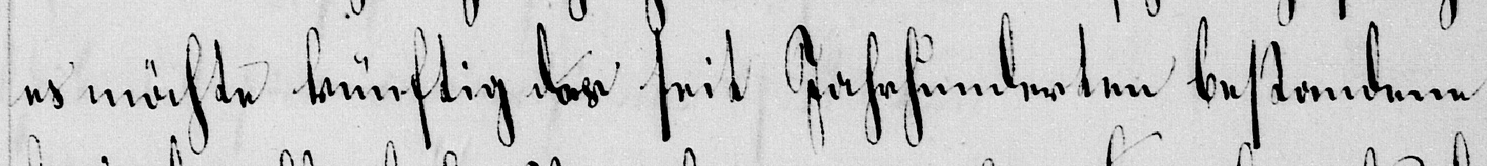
es möchte künftig das seit Jahrhunderten bestandene
